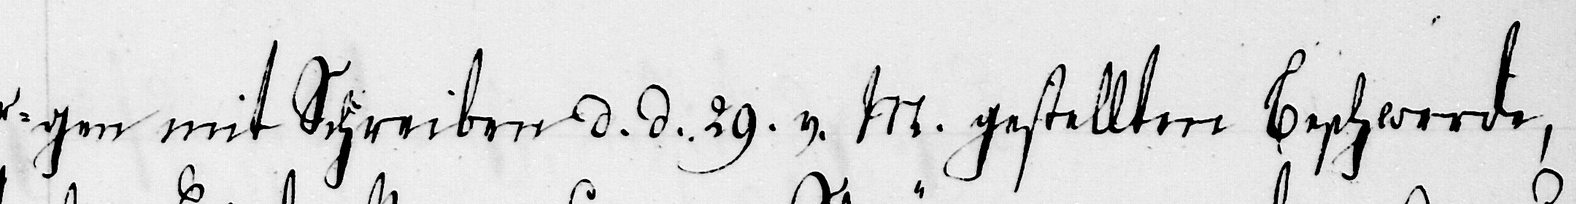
gen mit Schreiben d. d. 29. v. M. gestellten Beschwerde,
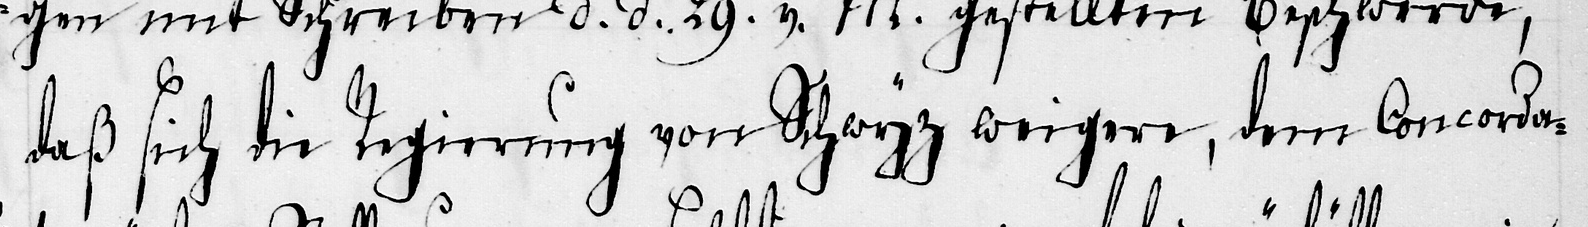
daß sich die Regierung von Schwyz weigere, dem Concorda¬
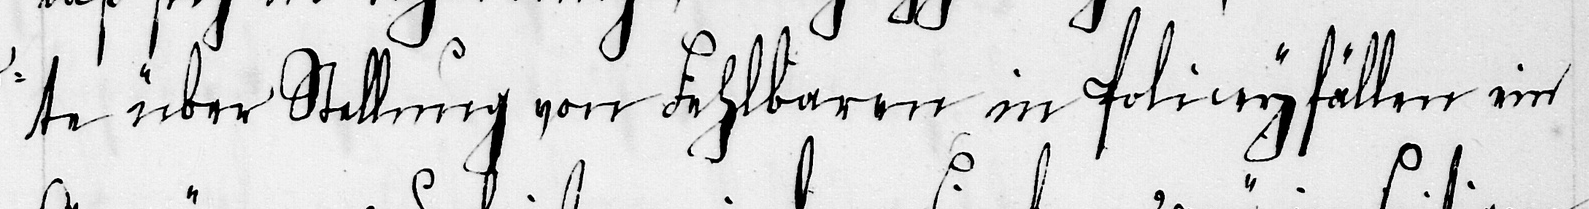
te über Stellung von Fehlbaren in Policeyfällen ein
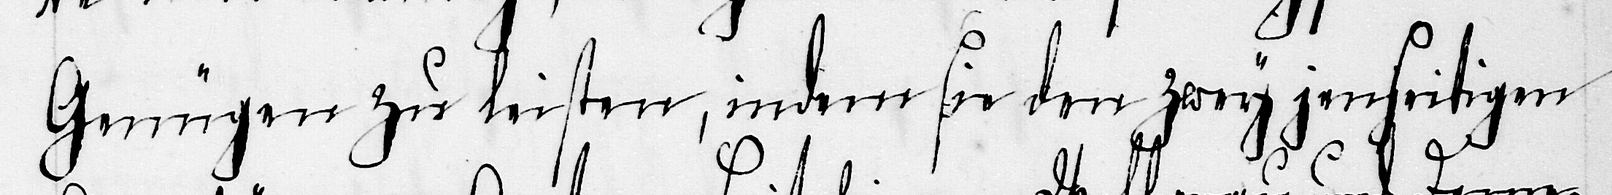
Genügen zu leisten, indem sie den zwey jenseitigen
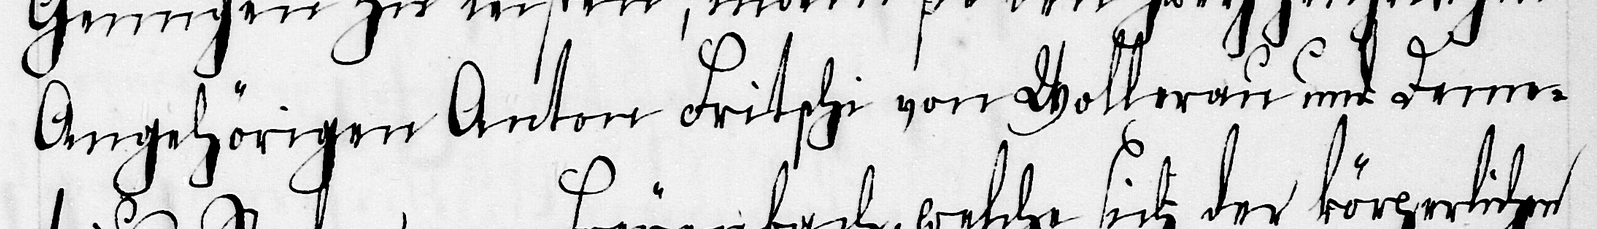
Angehörigen Anton Fritschi von Wollerau und Deme¬
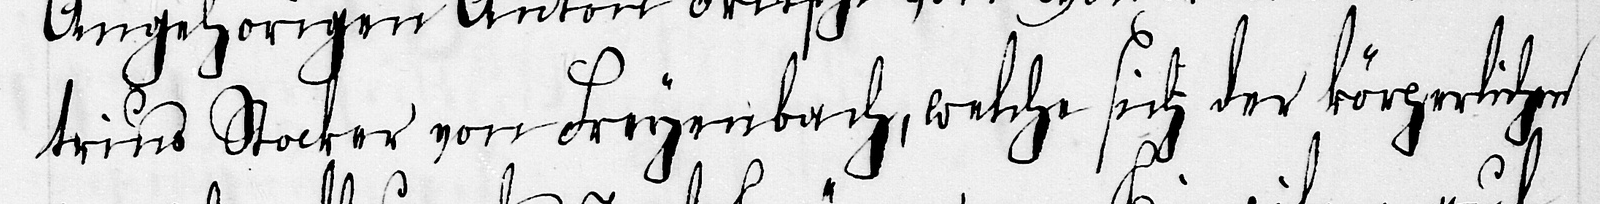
trius Stocker von Freyenbach, welche sich der bürgerlichen
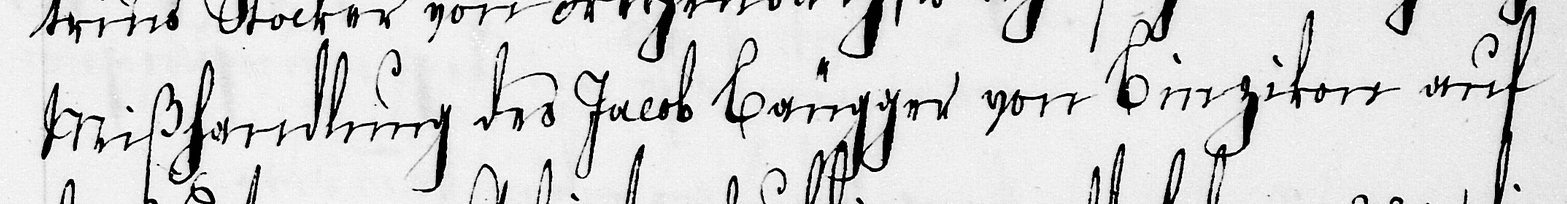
Mißhandlung des Jacob Bäugger Binzikon auf
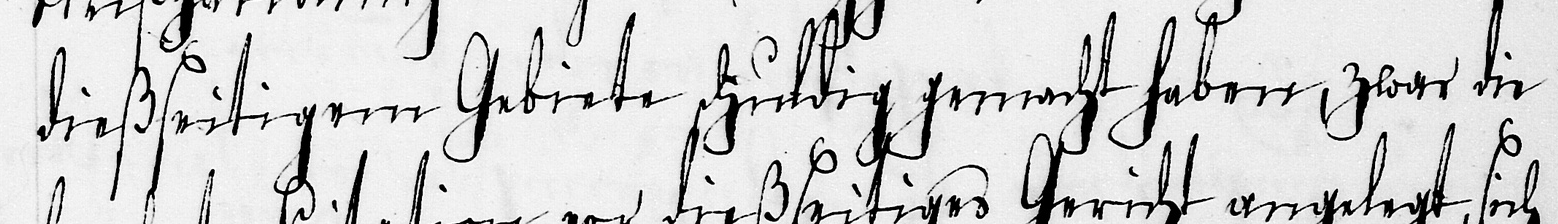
dießseitigem Gebiete schuldig gemacht haben, zwar die
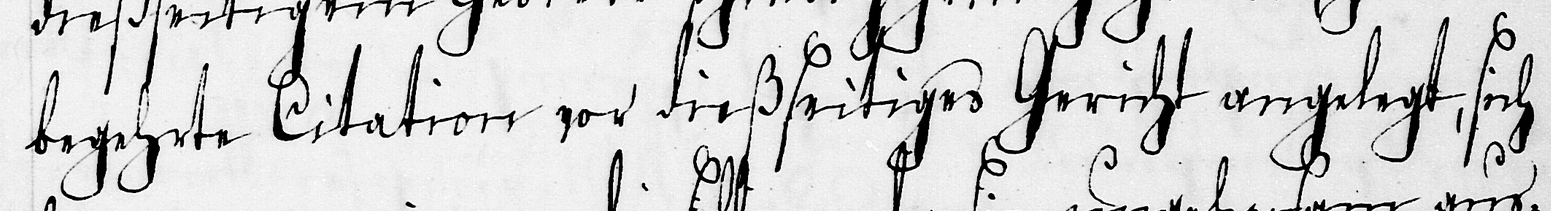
begehrte Citation vor dießseitiges Gericht angelegt, sich
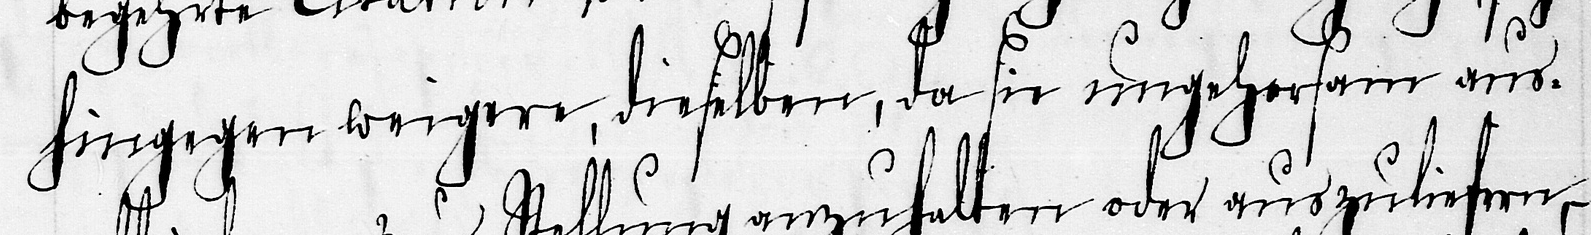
hingegen weigere, dieselben, da sie ungehorsam aus¬
